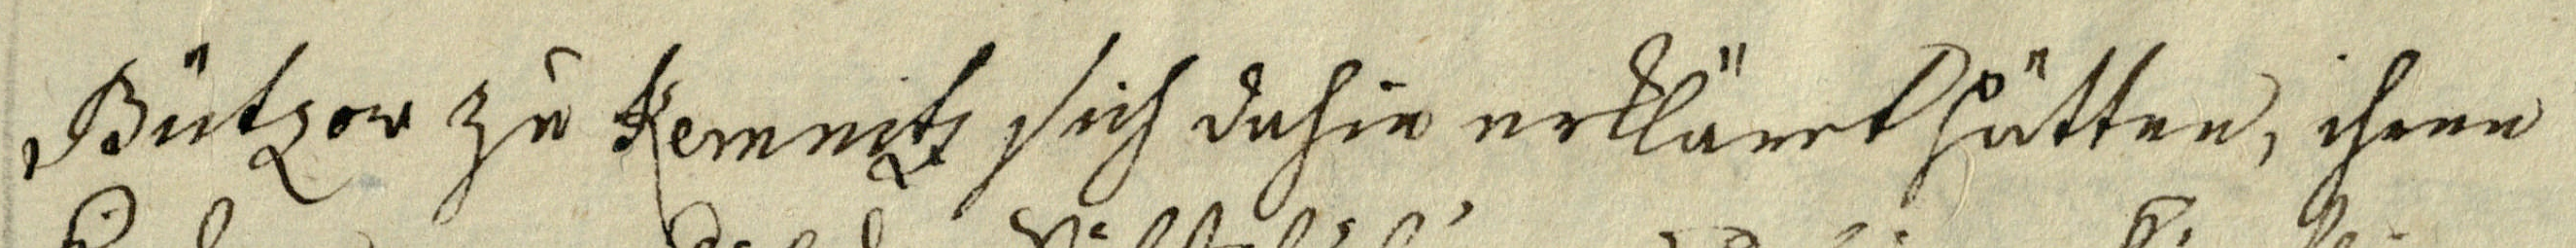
Bützow zu Kemnitz sich dahin erkläret hätten, ihren
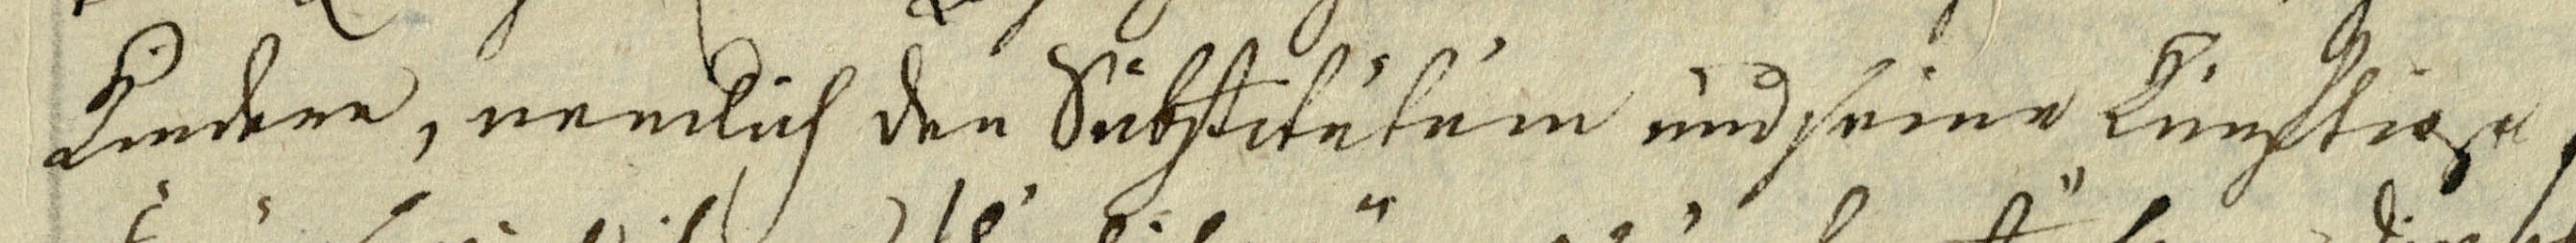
Kindern, nemlich den Substitutum und seine künftige
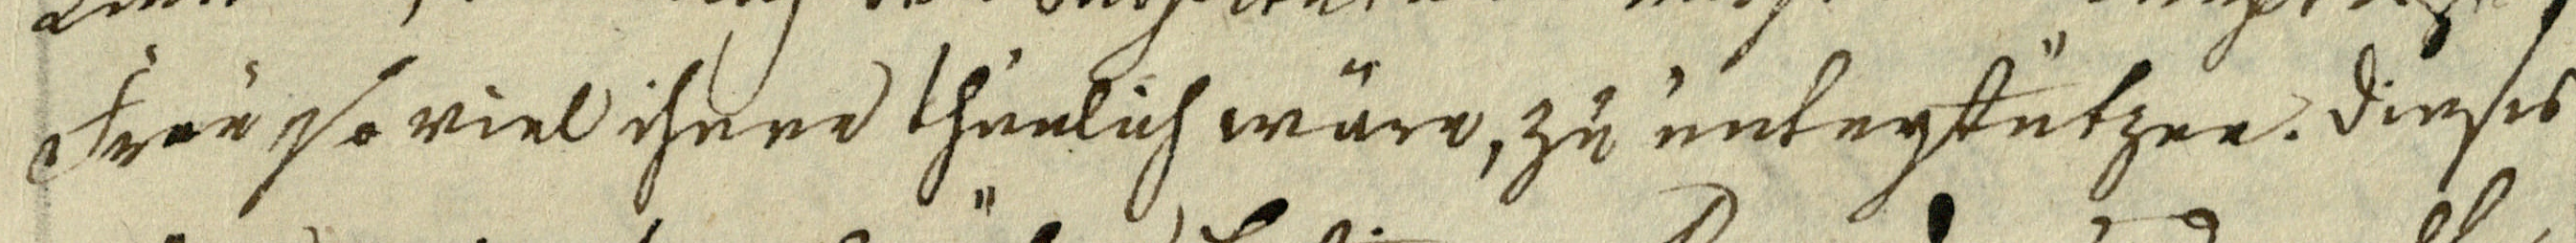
Frau so viel ihnen thunlich wäre, zu unterstützen. Dieses
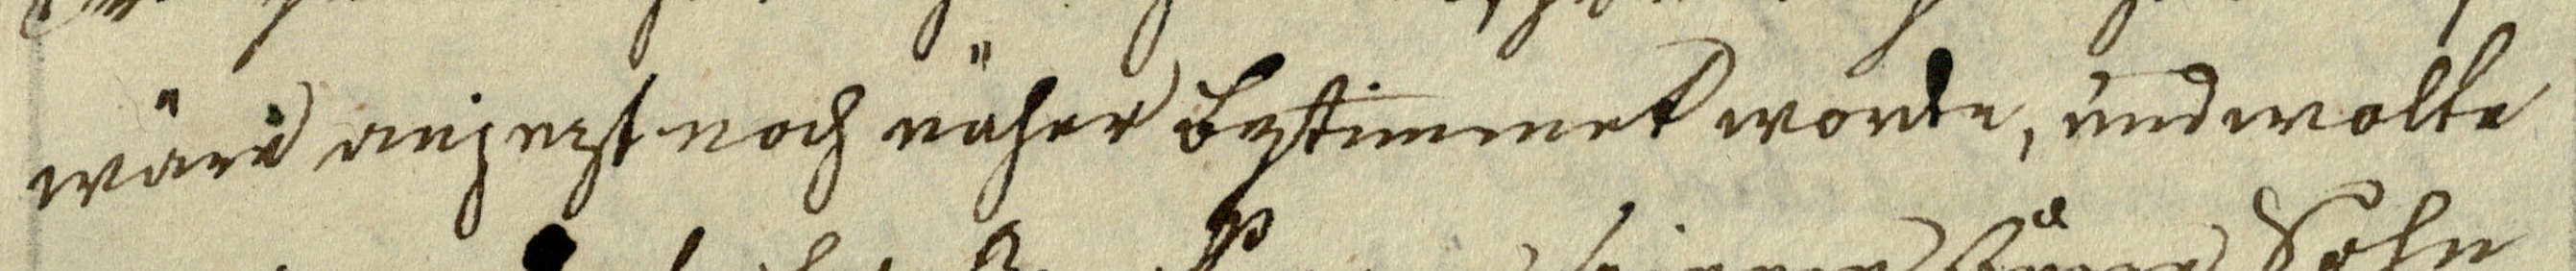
wäre anjezt noch näher bestimmet worden, und wolte
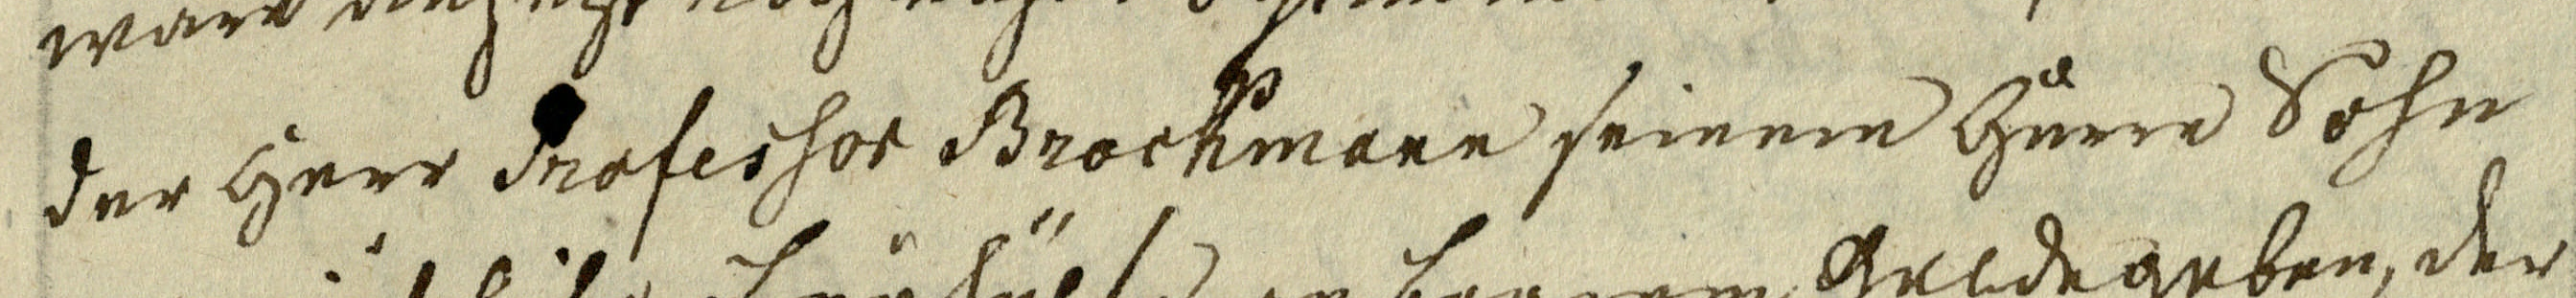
der Herr Professor Brockmann seinem Herrn Sohn
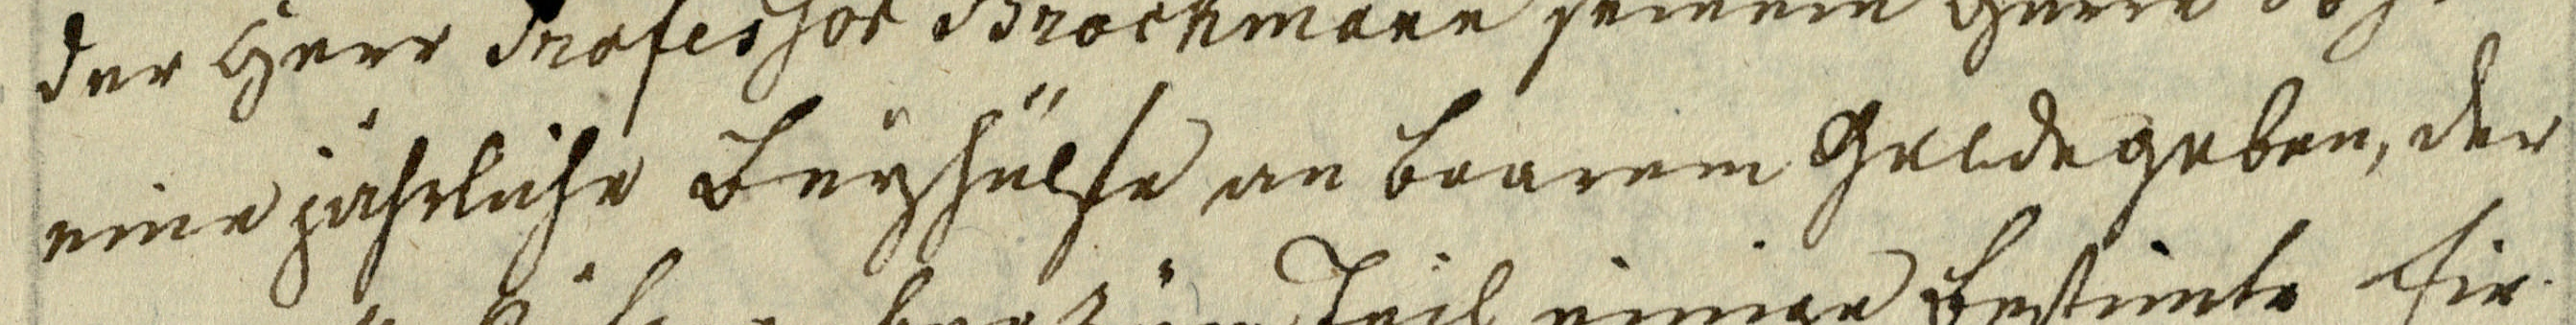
eine jährliche Beÿhülfe an baarem Gelde geben, der
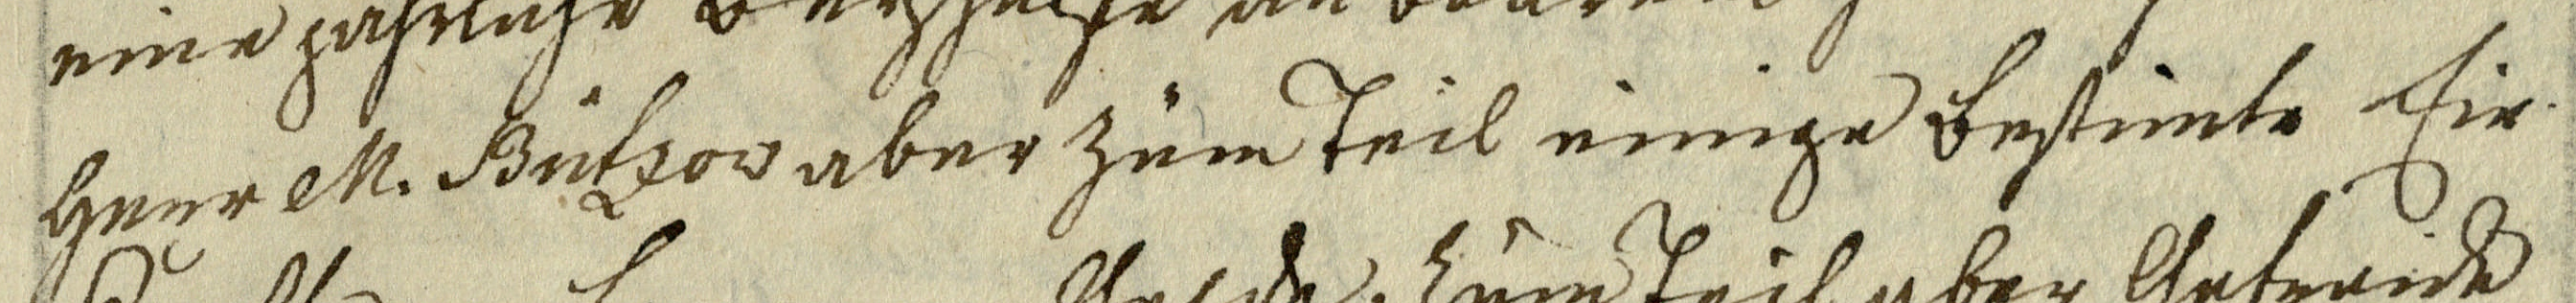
Herr M. Bützow aber zum Teil einige bestimte Ein¬
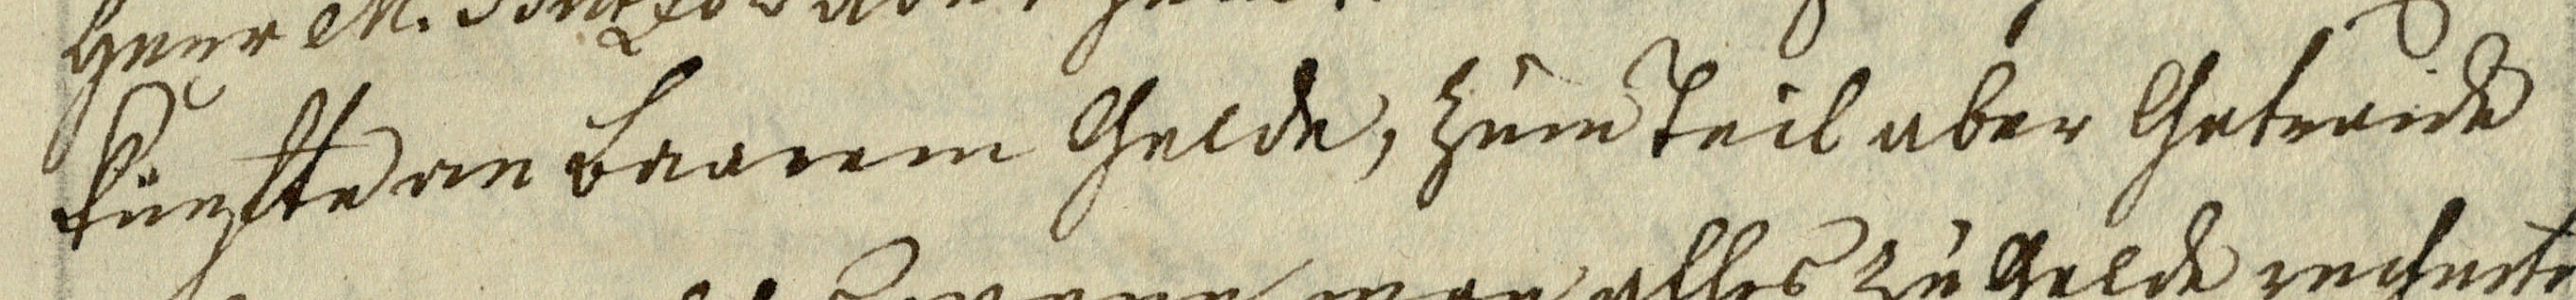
künfte an Baarem Gelde, zum Teil aber Getreide
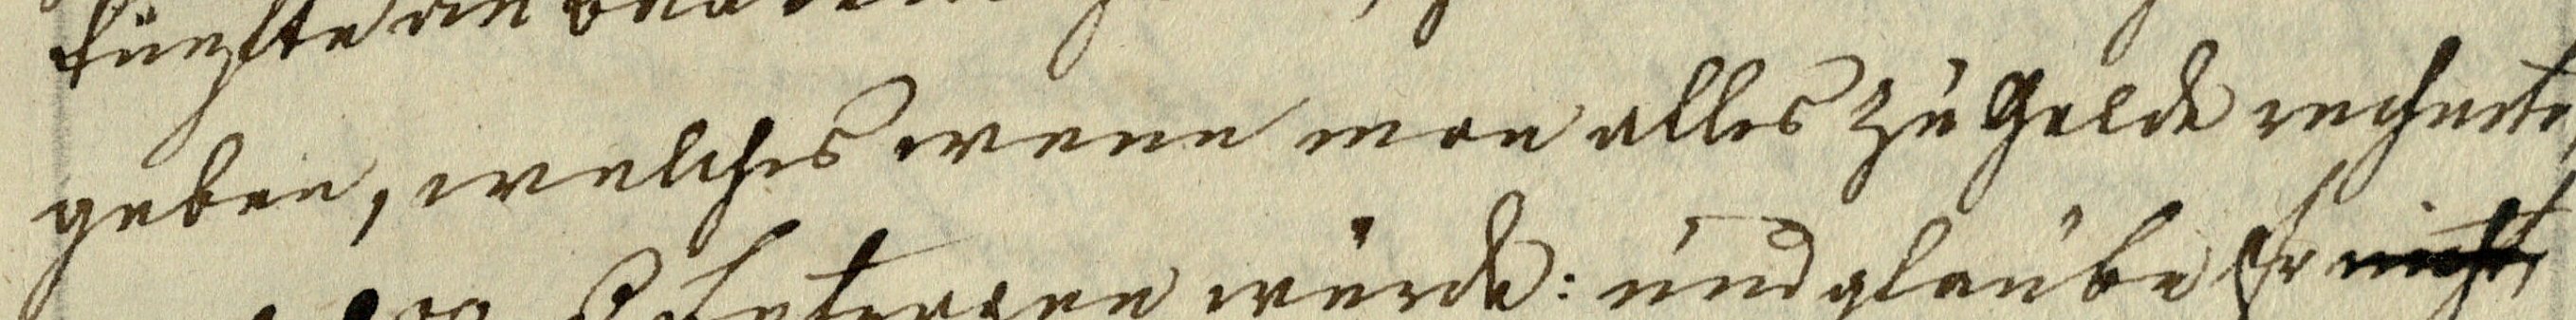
geben, welches wenn man alles zu Gelde rechnete,
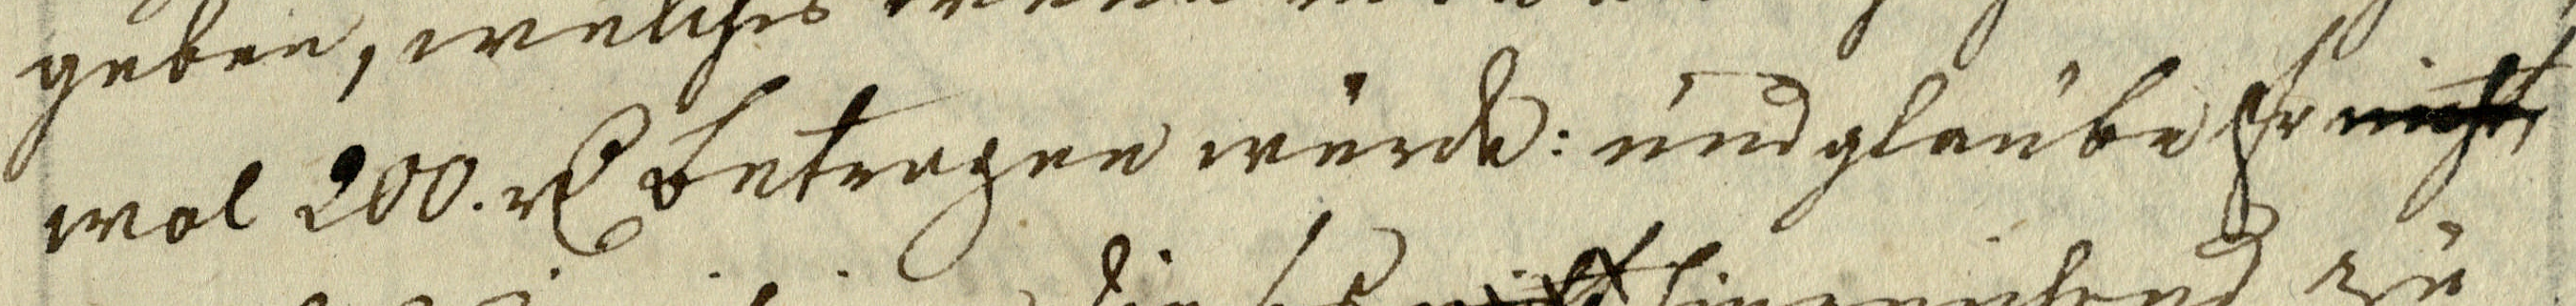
wol 200 rtl betragen würde: und glaube Er nicht
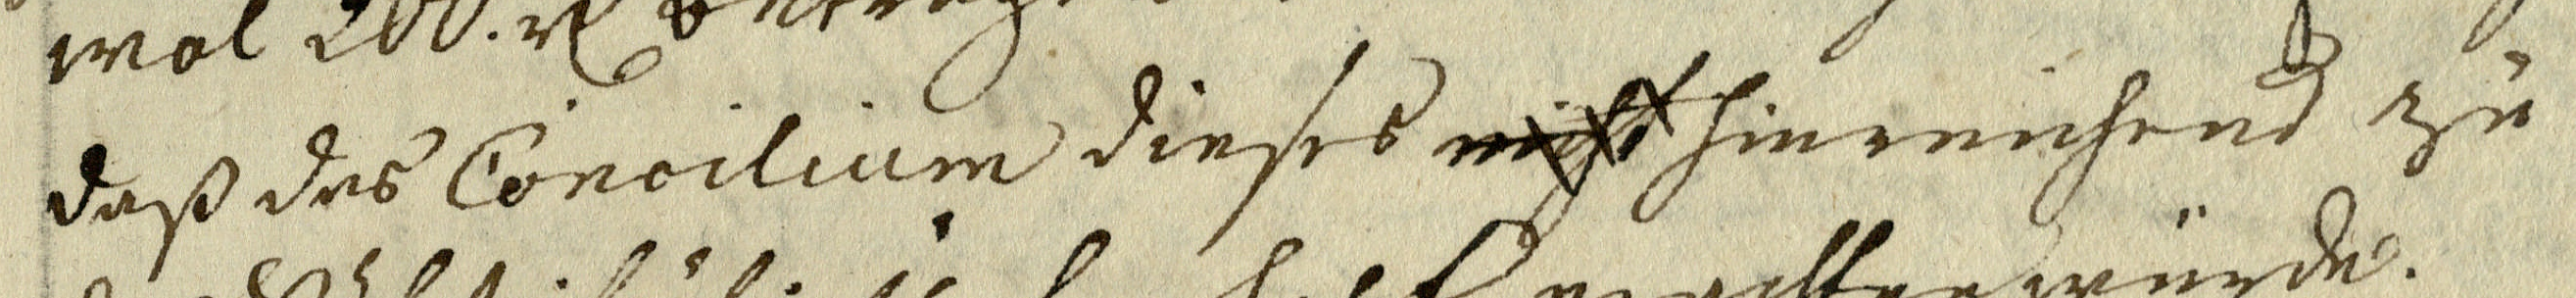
daß das Concilium dieses nicht hinreichend zu
